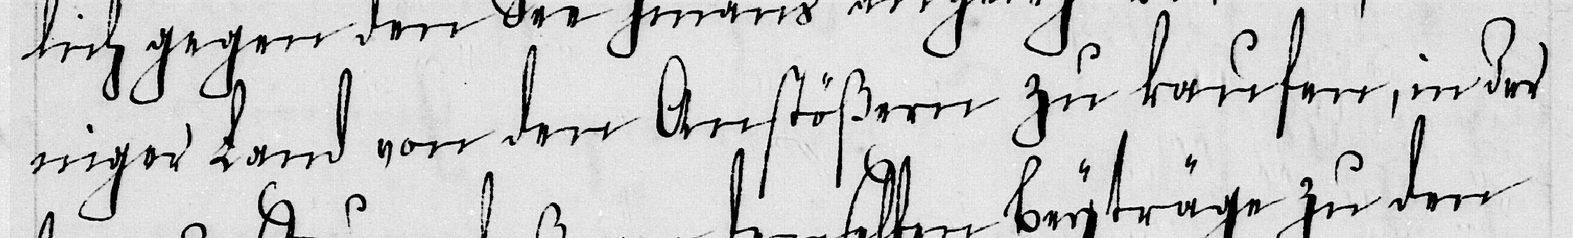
niger Land von den Anstößen zu kaufen, in der
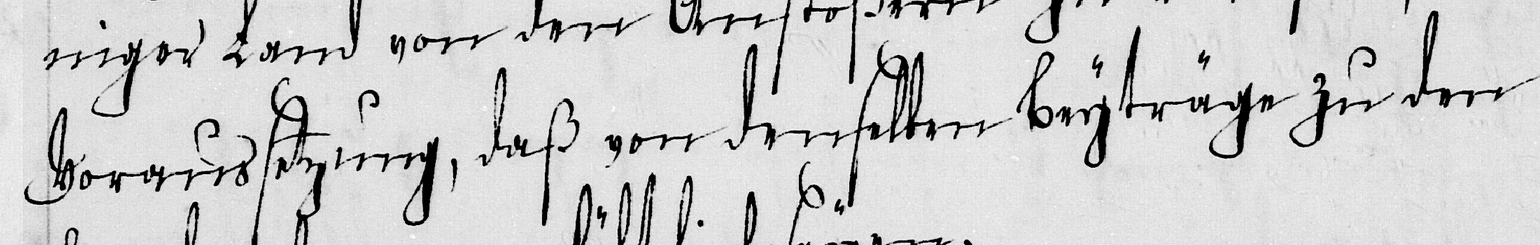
Voraussetzung, daß von denselben Beyträge zu den
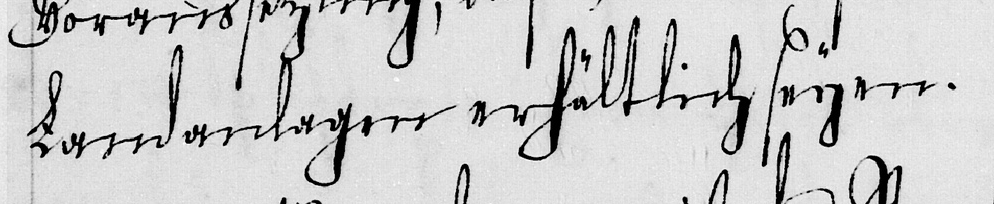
Landanlagen erhältlich seyen.
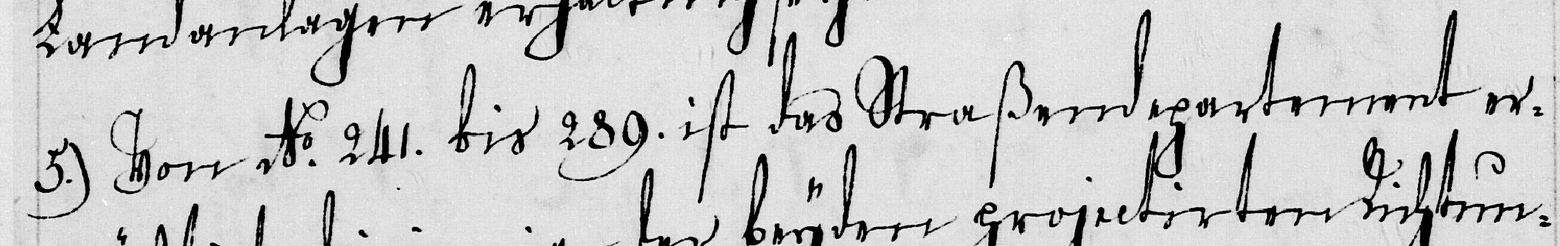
5.) Von No. 241. bis 289. ist das Straßendepartement er¬
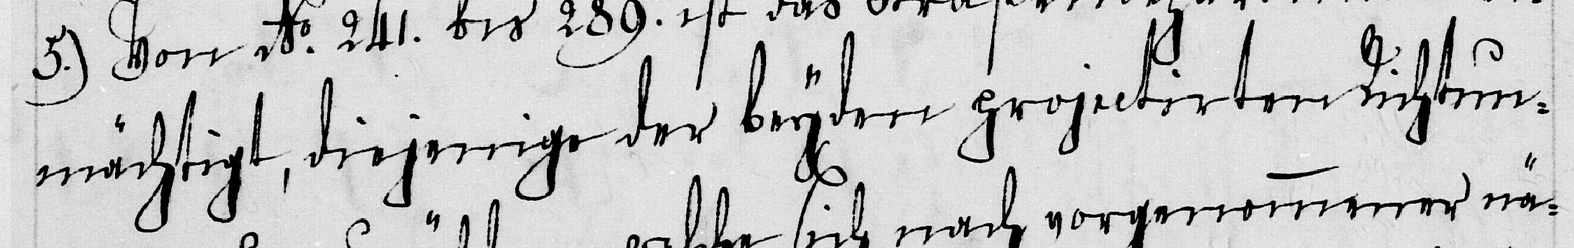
mächtigt, diejenige der beyden projectirten Richtun¬
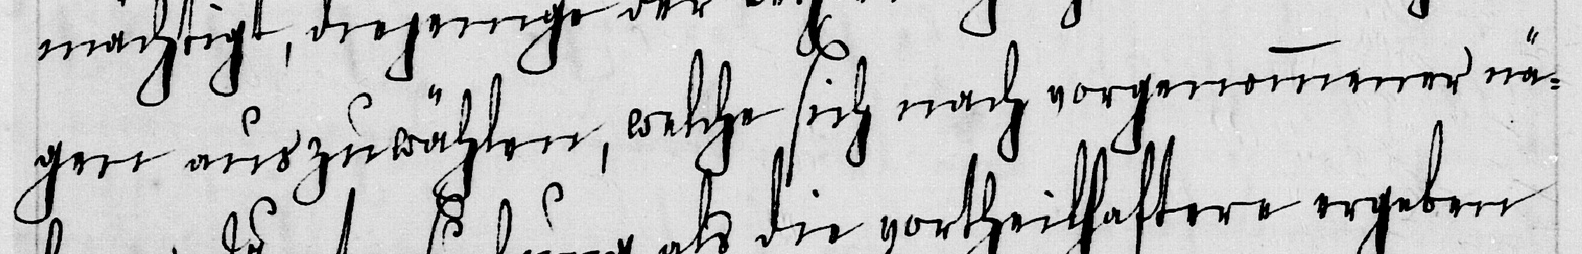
gen auszuwählen, welche sich nach vorgenommener nä¬
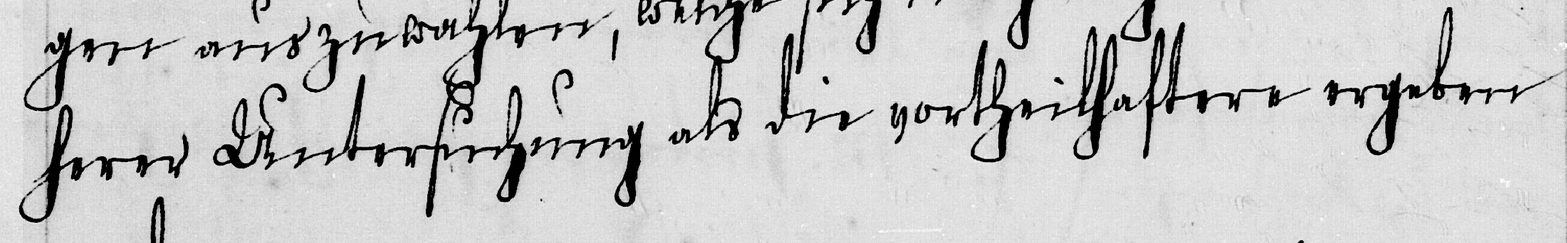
herer Untersuchung als die vortheilhaftere ergeben
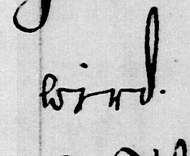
wird.
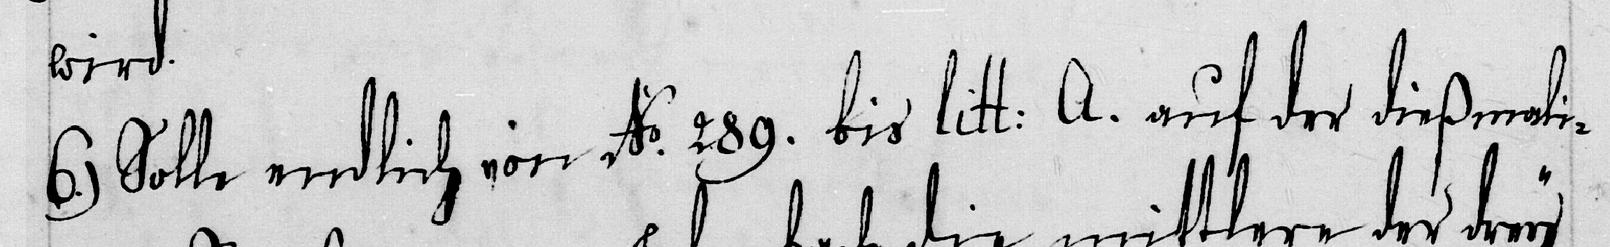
6.) Solle endlich von No. 289. bis litt: A. auf der dießmali¬
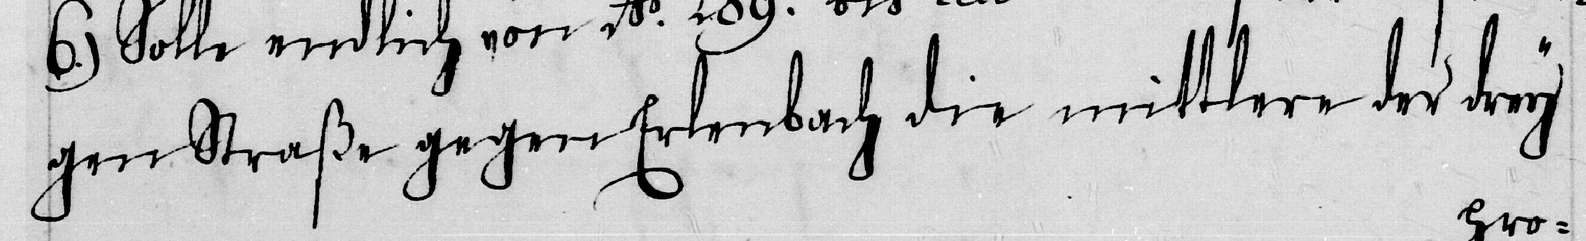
gen Straße gegen Erlenbach die mittlere der drey
